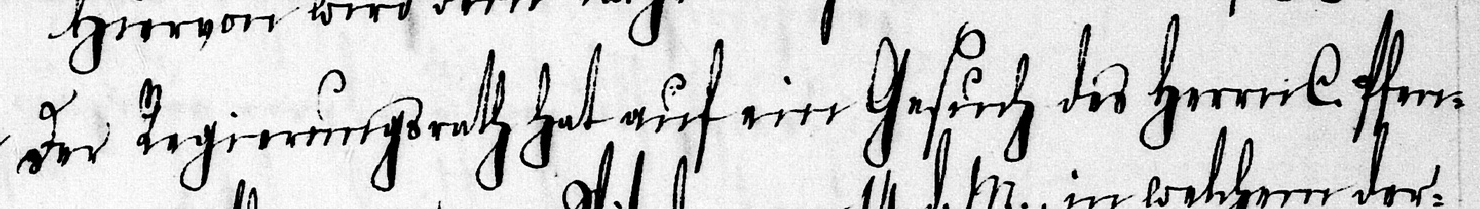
Der Regierungsrath hat auf ein Gesuch des Herrn C. Pfen¬
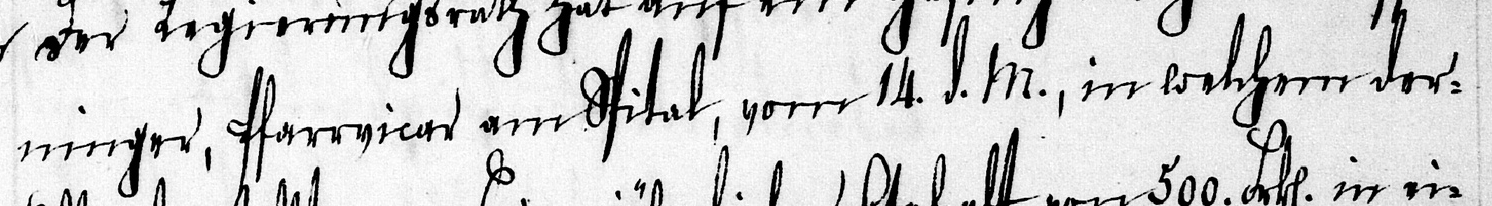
ninger, Pfarrvicar am Spital, vom 14. d. M., in welchem der¬
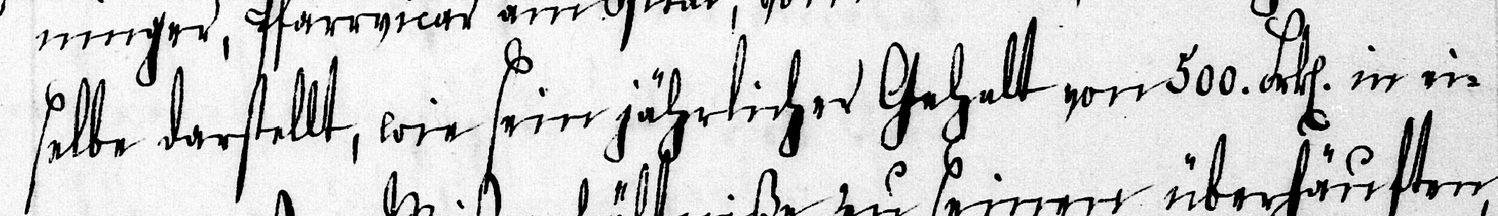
selbe darstellt, wie sein jährliches Gehalt von 500. Frk[en]. in
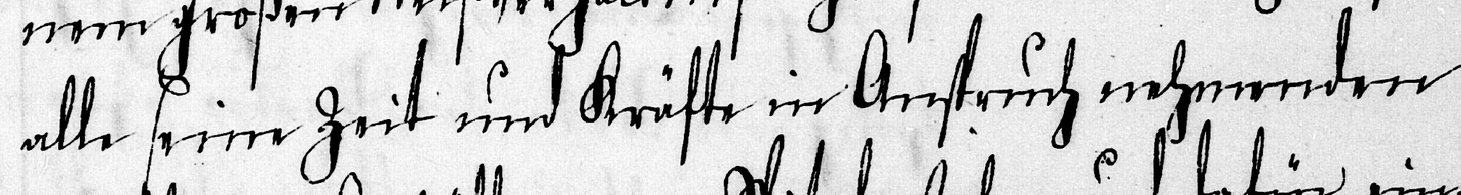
alle seine Zeit und Kräfte in Anspruch nehmenden
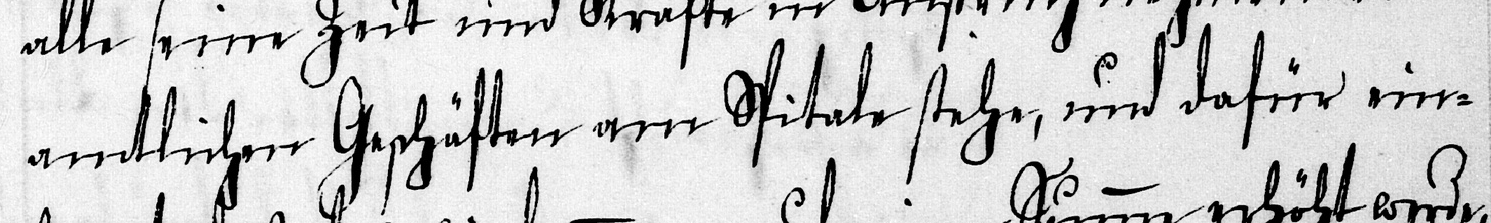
amtlichen Geschäften am Spitale stehe, und dafür ein¬
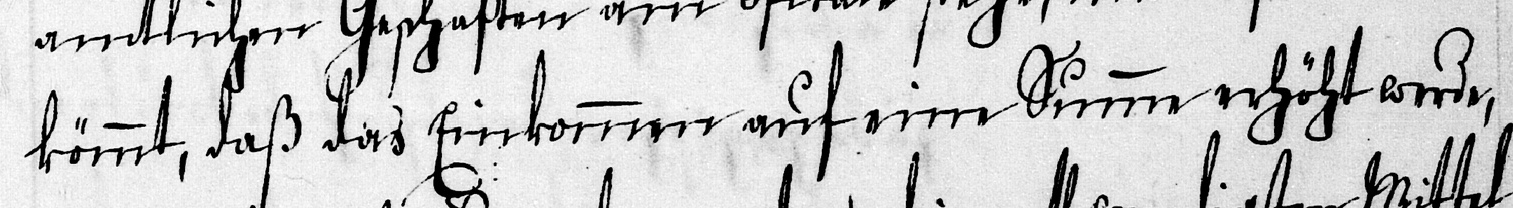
kömmt, daß das Einkommen auf eine Summe erhöht werde,
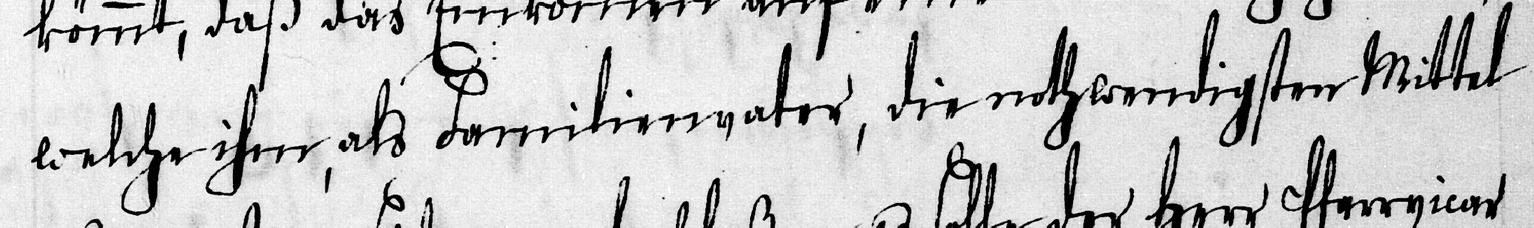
welche ihm, als Familienvater, die nothwendigsten Mittel
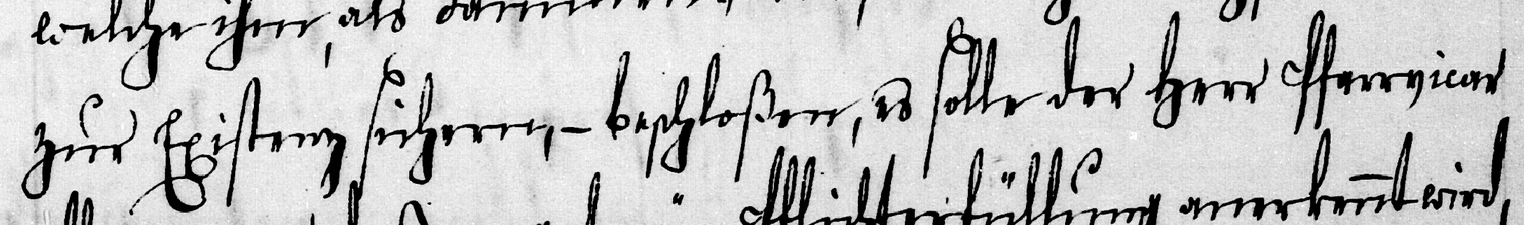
zur Existenz sichern, – beschloßen, es solle der Herr Pfarrvicar
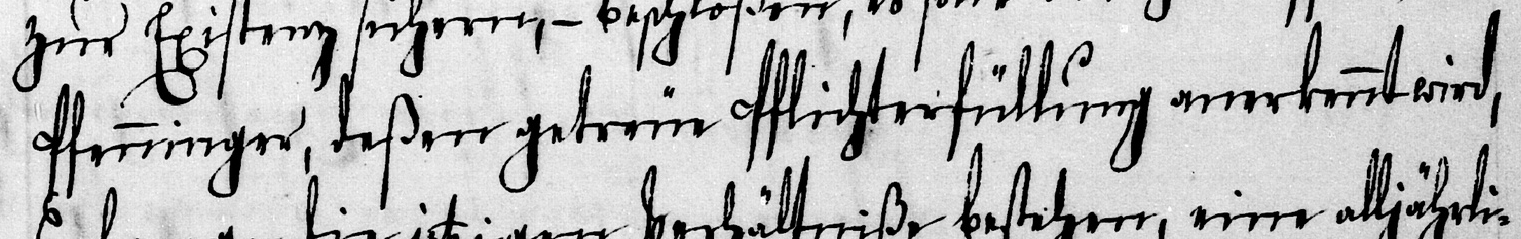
Pfenninger, deßen getreue Pflichterfüllung anerkennt wird,
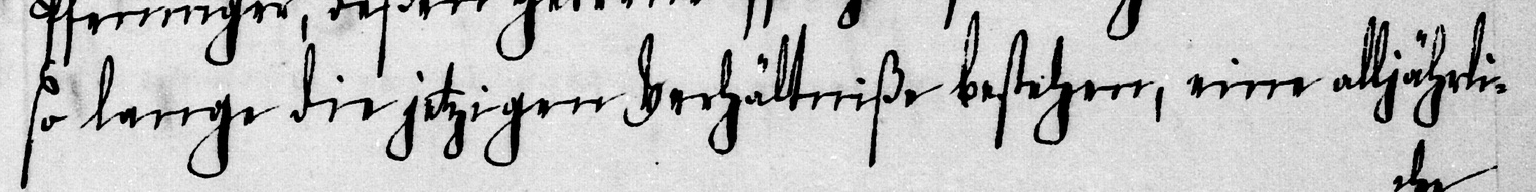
so lange die jetzigen Verhältniße bestehen, eine alljährli-
